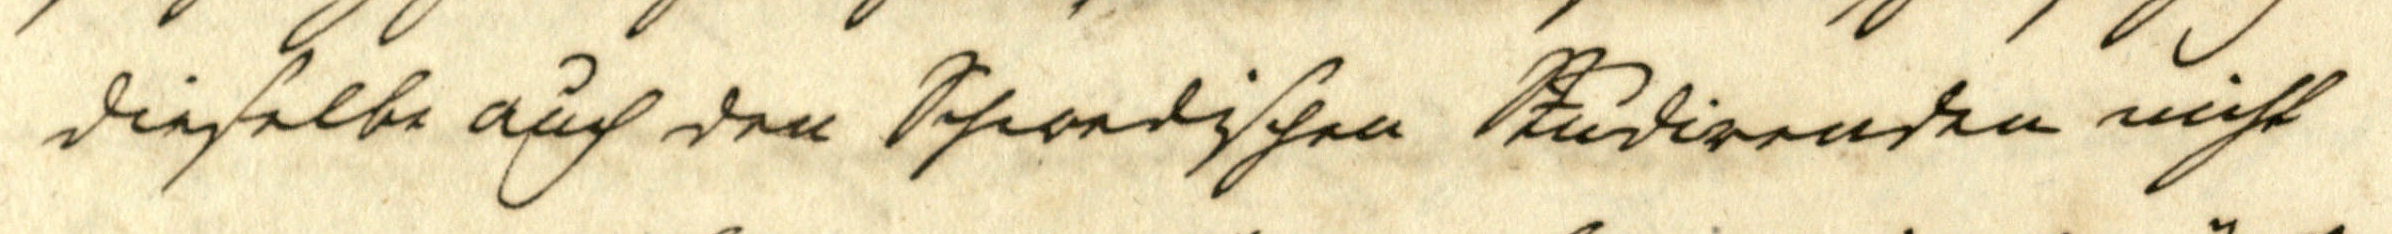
dieselbe auch den Schwedischen Studirenden nicht
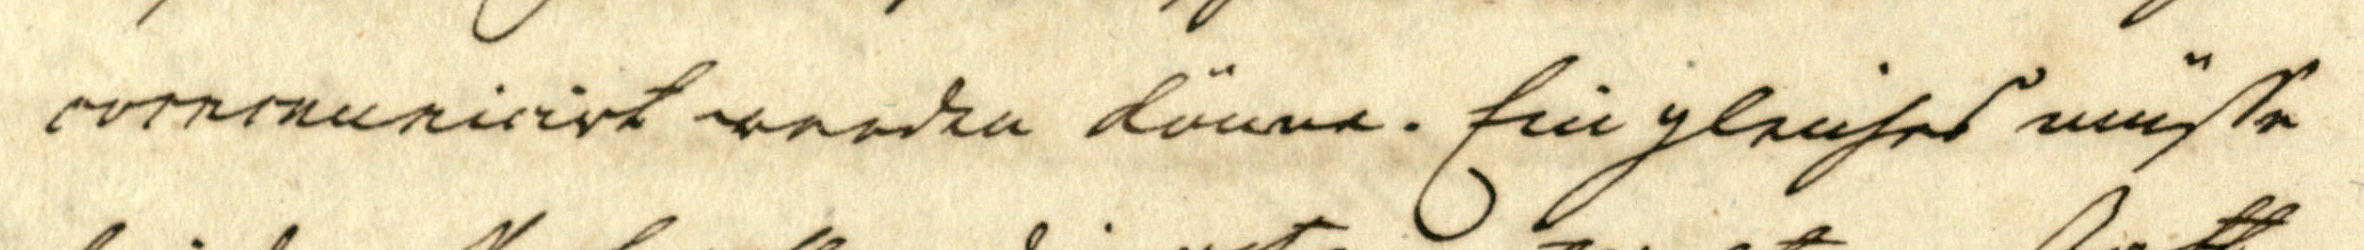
communicirt werden könne. Ein gleiches müsse
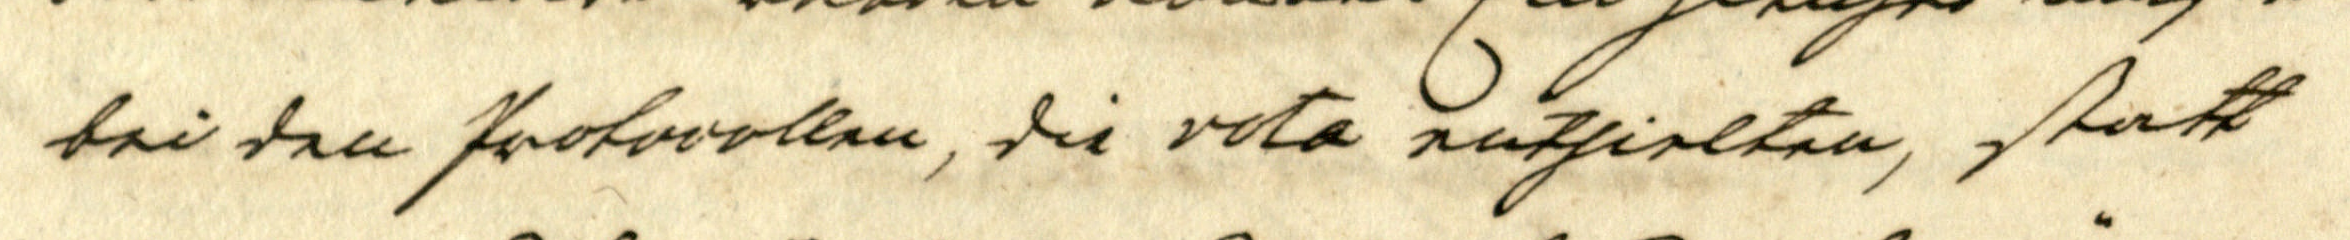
bei den Protocollen, die vota enthielten, statt
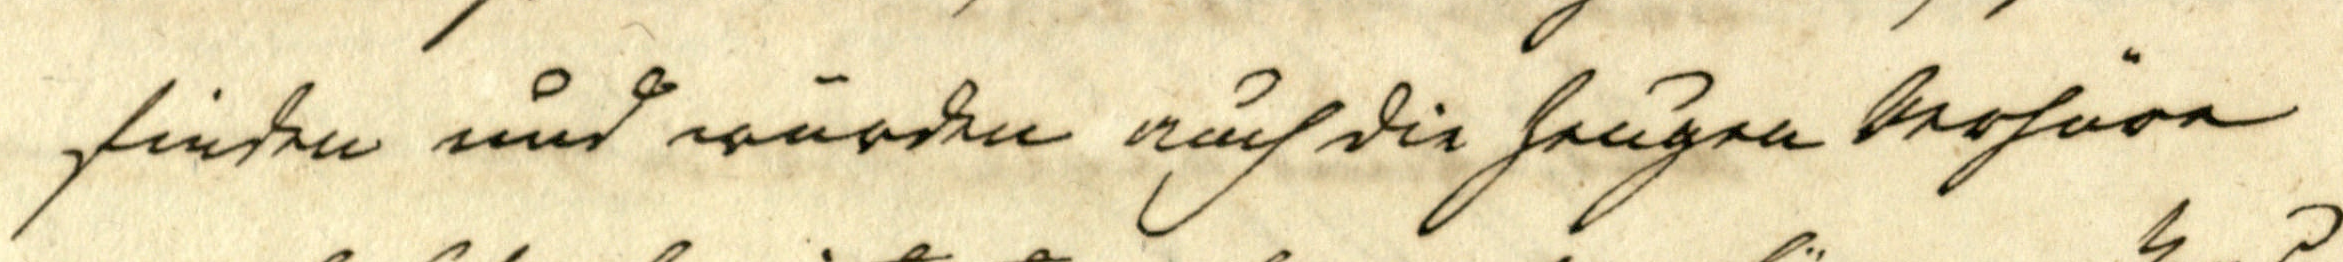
finden und würden auch die Zeugen Verhöre
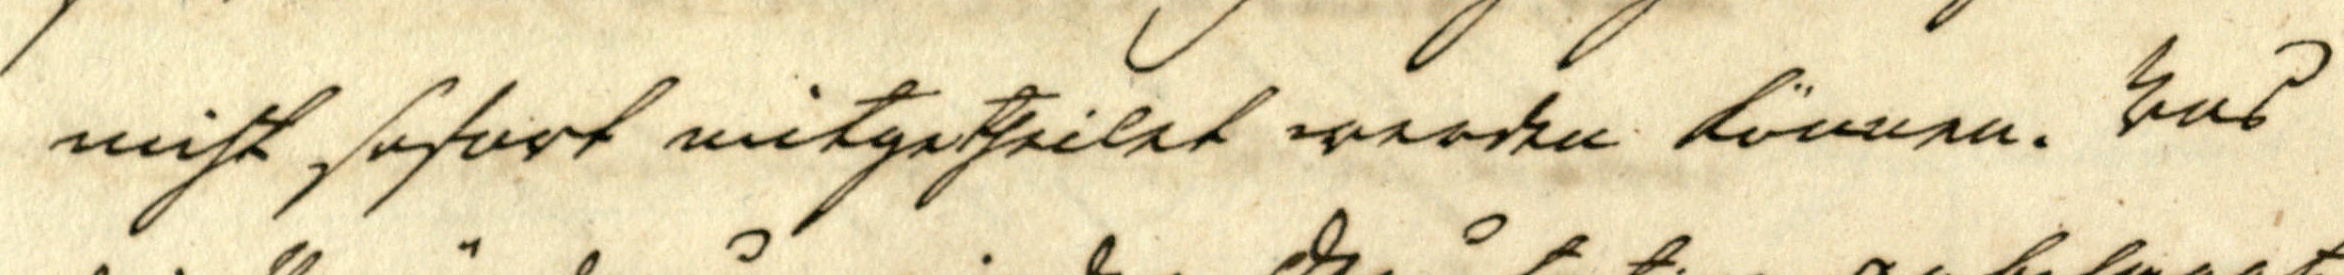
nicht sofort mitgetheilet werden können. Was
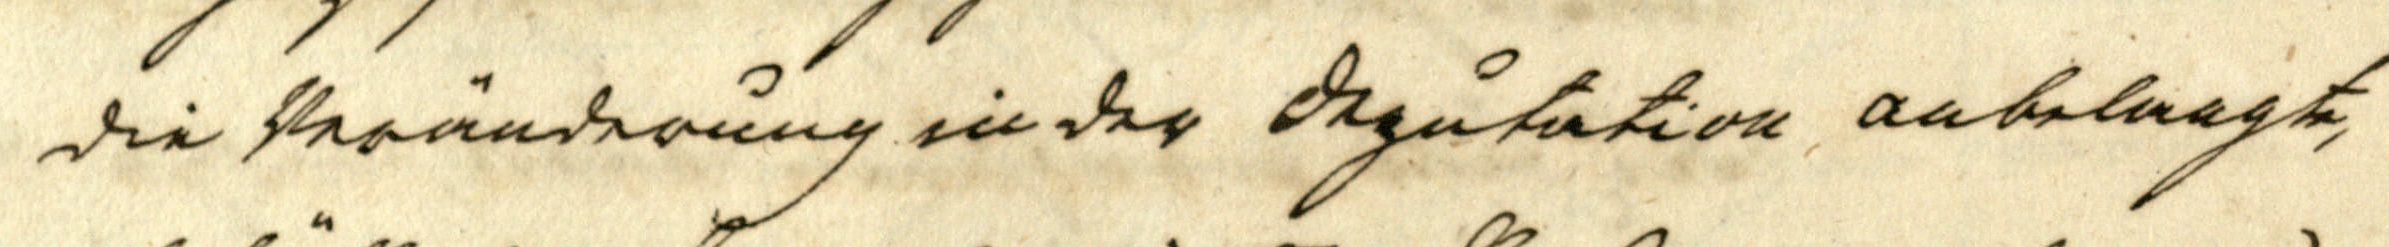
die Veränderung in der Deputation anbelangte,
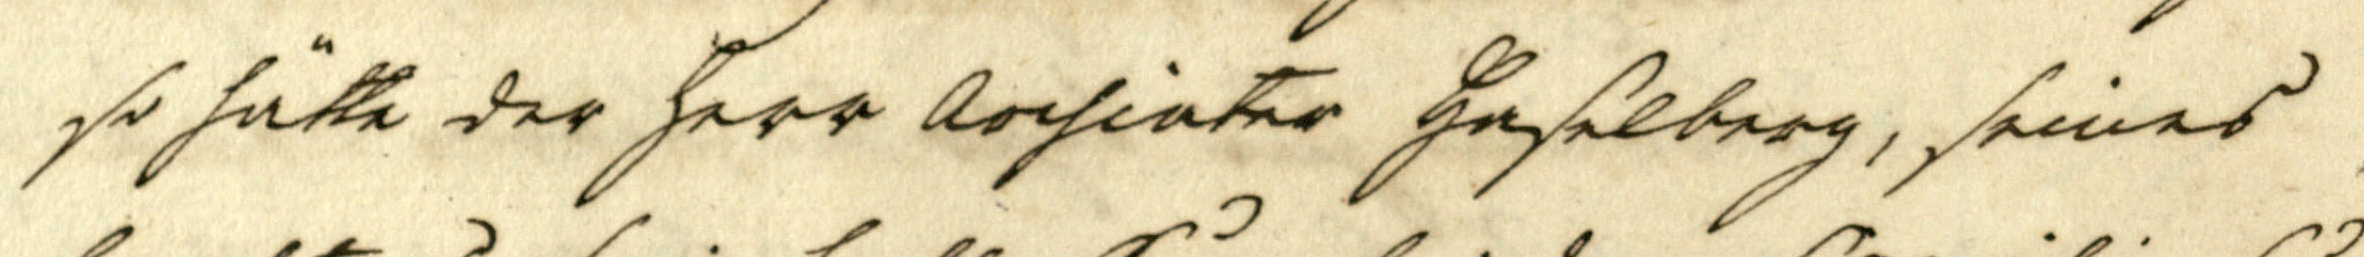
so hätte der Herr Archiater Haselberg, seines
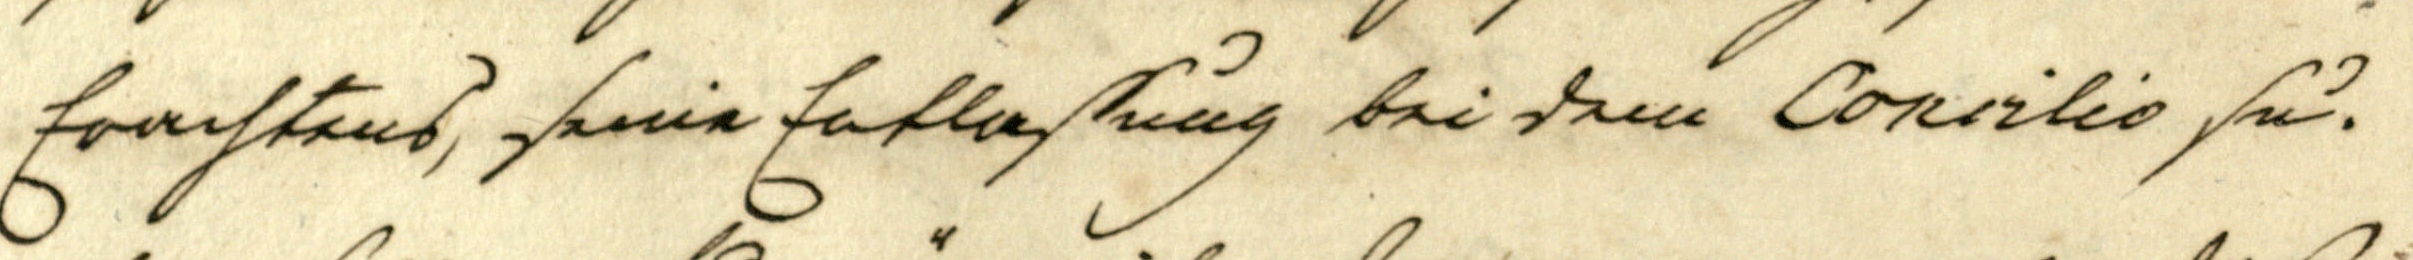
Erachtens, seine Entlassung bei dem Concilio su¬
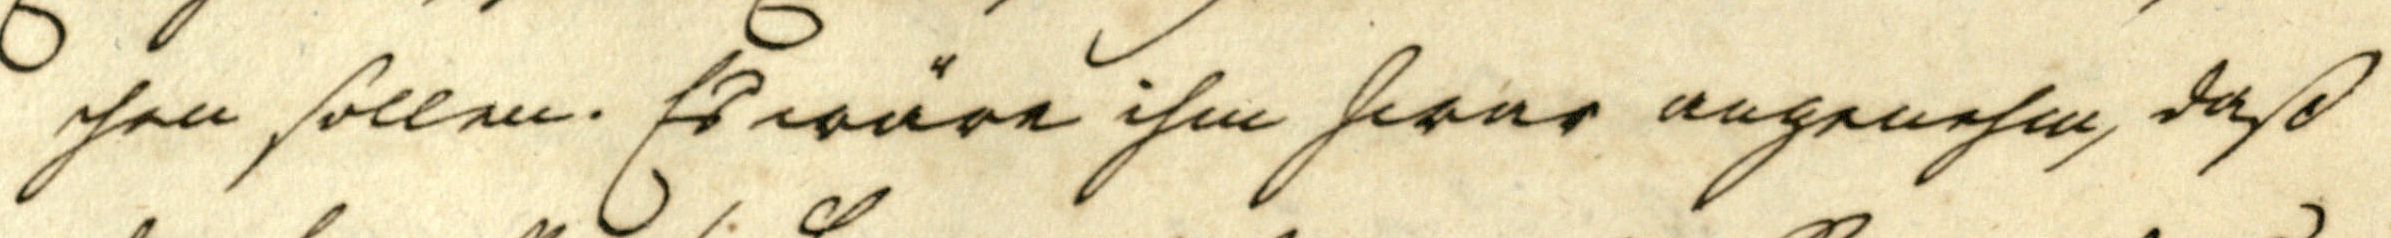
chen sollen. Es wäre ihm zwar angenehm, daß
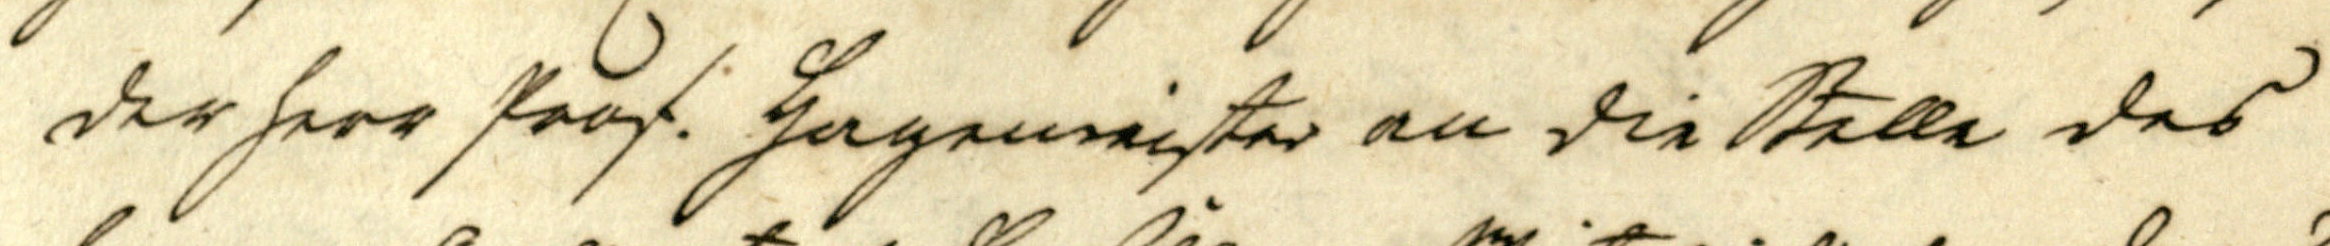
der Herr Prof. Hagemeister an die Stelle des
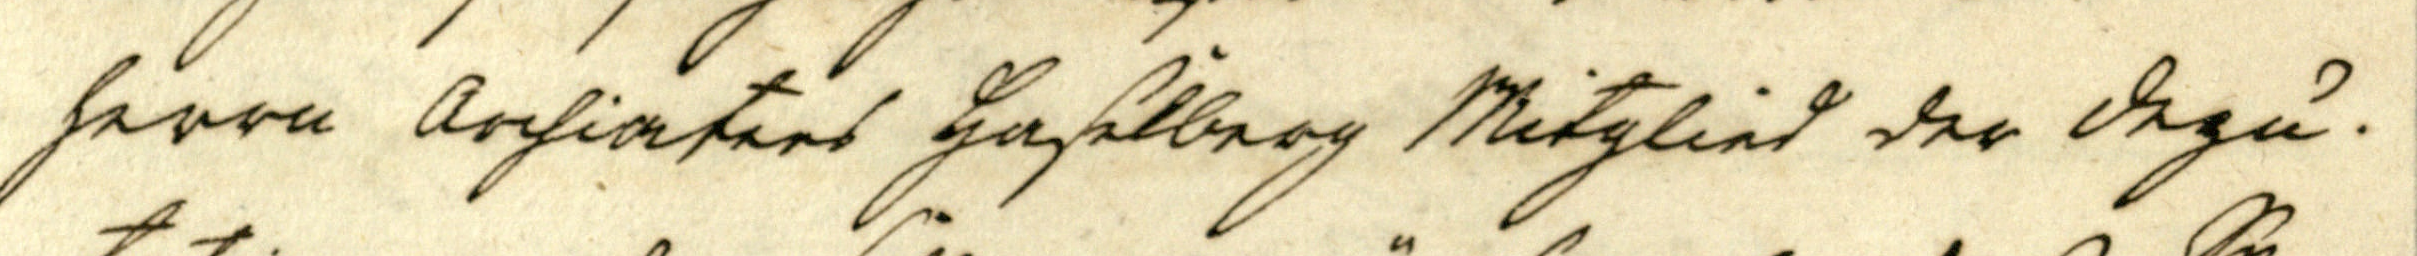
Herrn Archiaters Haselberg Mitglied der Depu¬
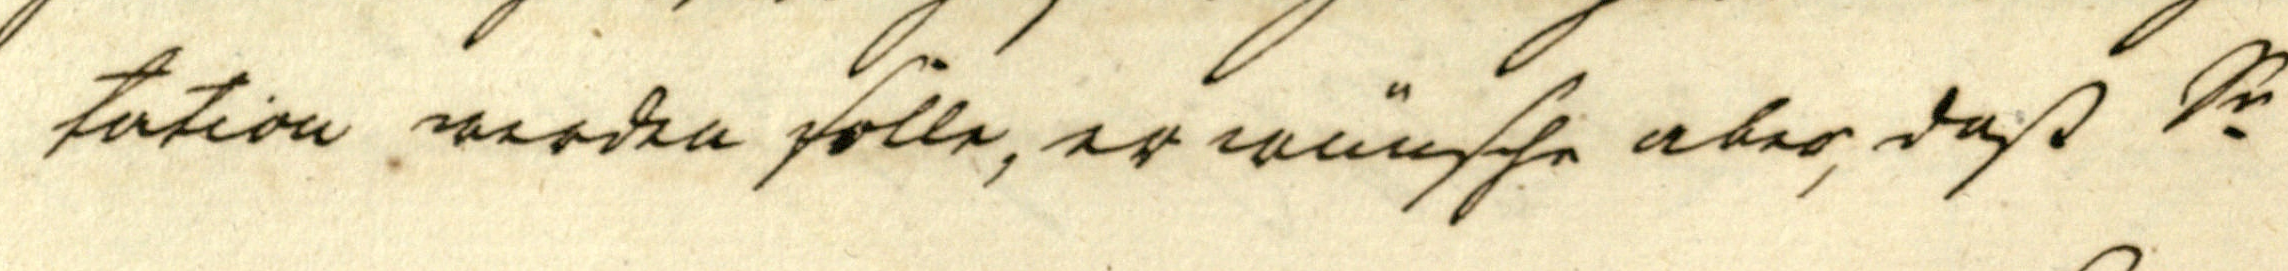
tation werden solle, er wünsche aber, daß Sr
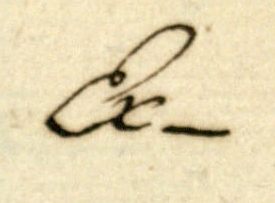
Ex¬
